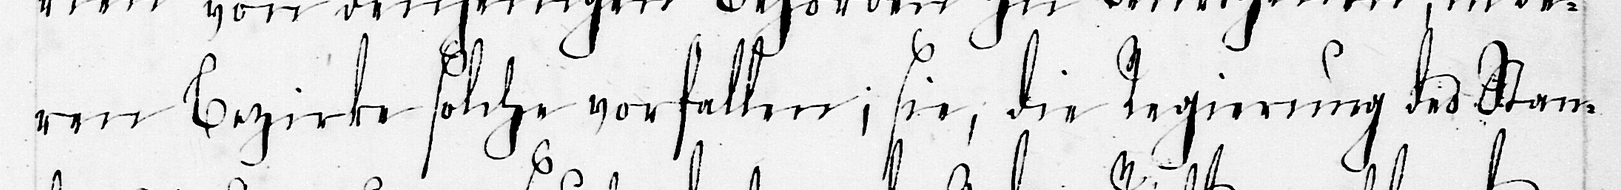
ren Bezirke solche vorfallen; sie, die Regierung des Stan¬
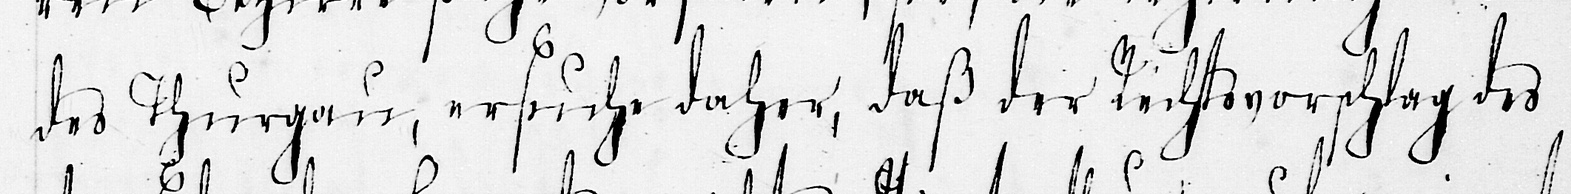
des Thurgau, ersuche daher, daß der Rechtsvorschlag des
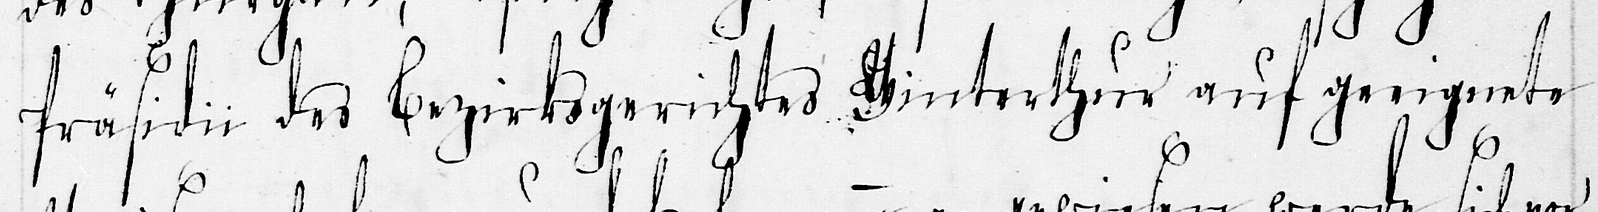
Präsidii des Bezirksgerichtes Winterthur auf geeignete
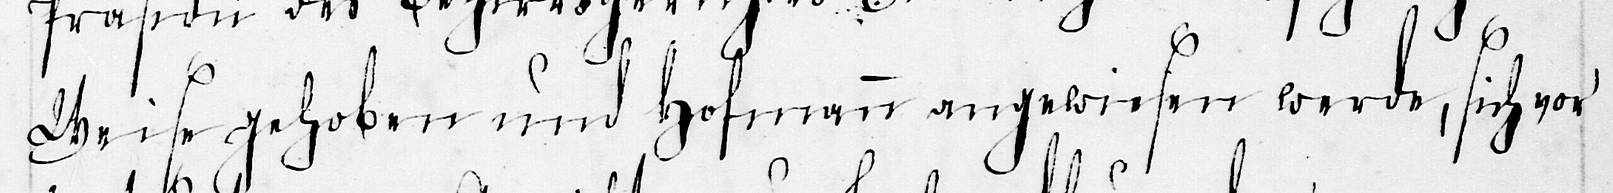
Weise gehoben und Hofmann angewiesen werde, sich vor
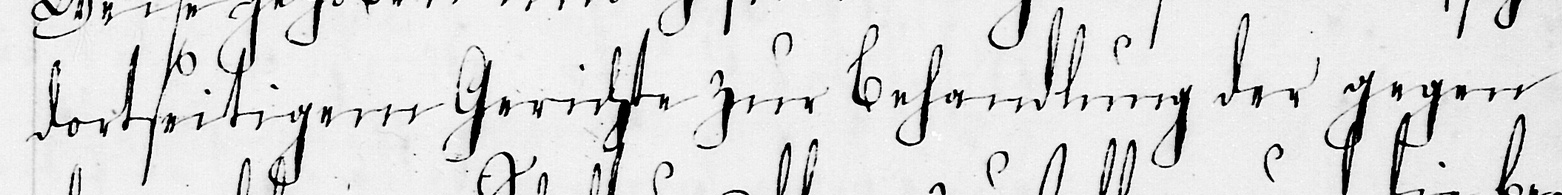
dortseitigem Gerichte zur Behandlung der gegen
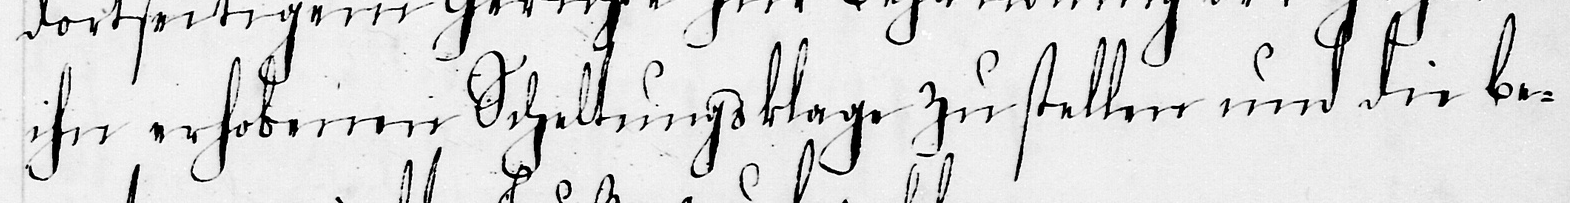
ihn erhobenen Scheltungsklage zu stellen und die be¬
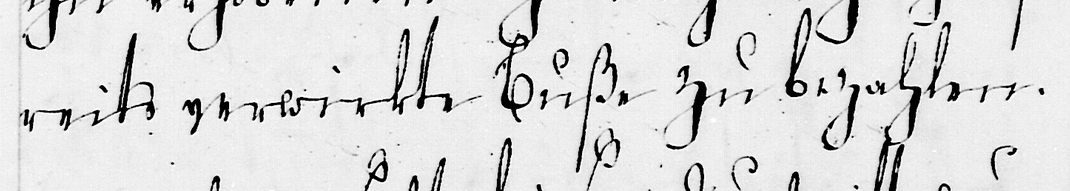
reits verwirkte Buße zu bezahlen.
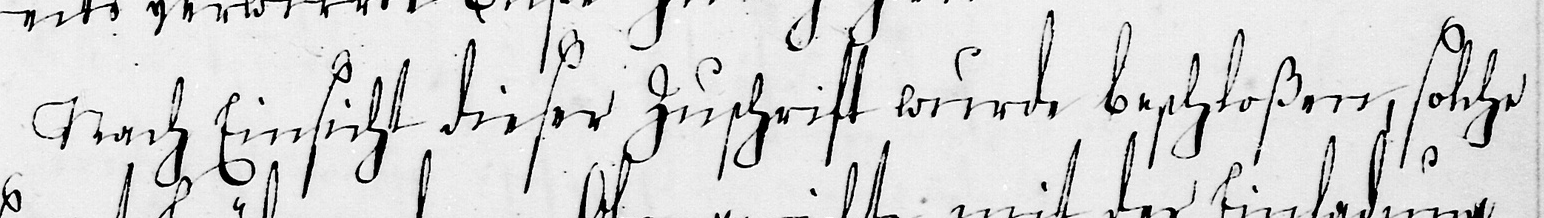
Nach Einsicht dieser Zuschrift wurde beschloßen, solche
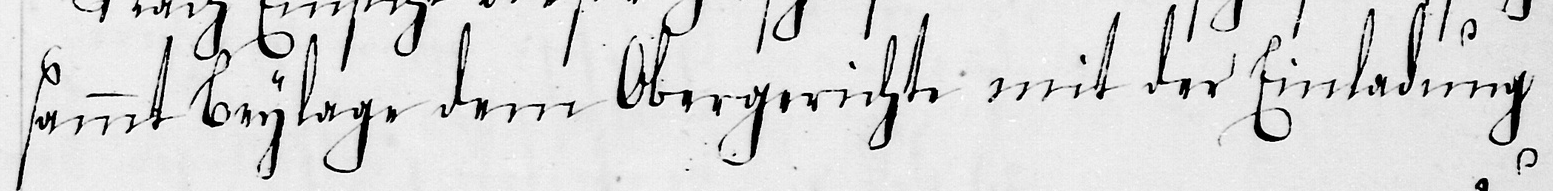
sammt Beylage dem Obergerichte mit der Einladung
